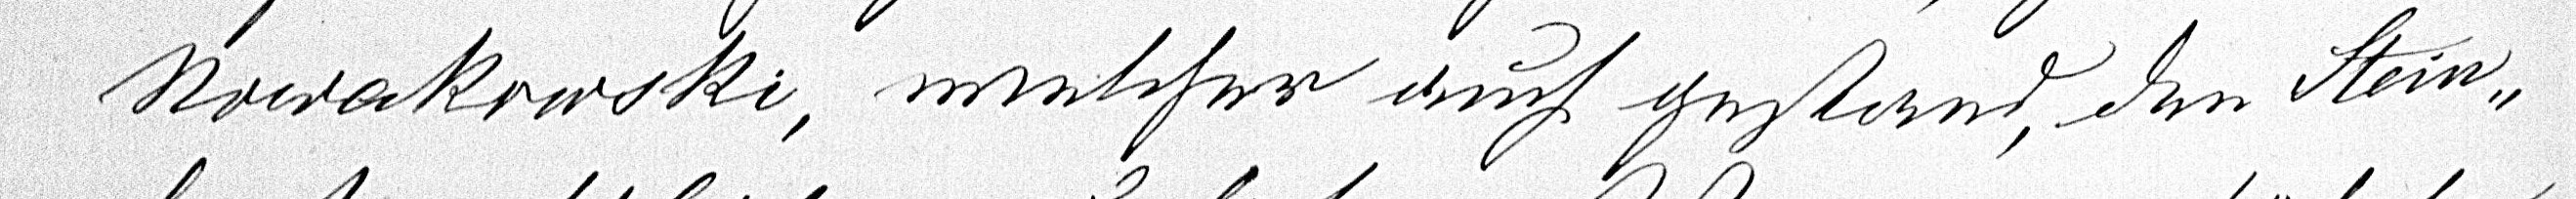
Nowakowski, welcher auch gestand, den Stein¬
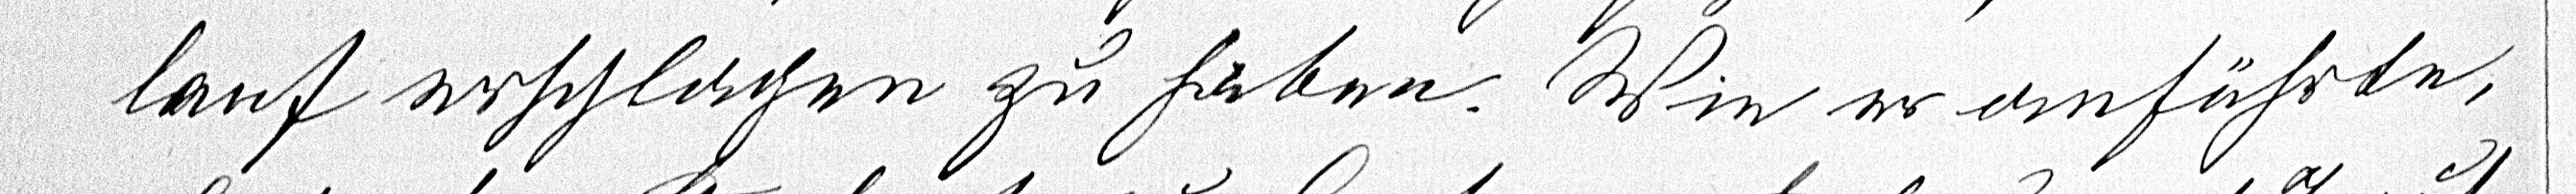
lauf erschlagen zu haben. Wie er anführte,
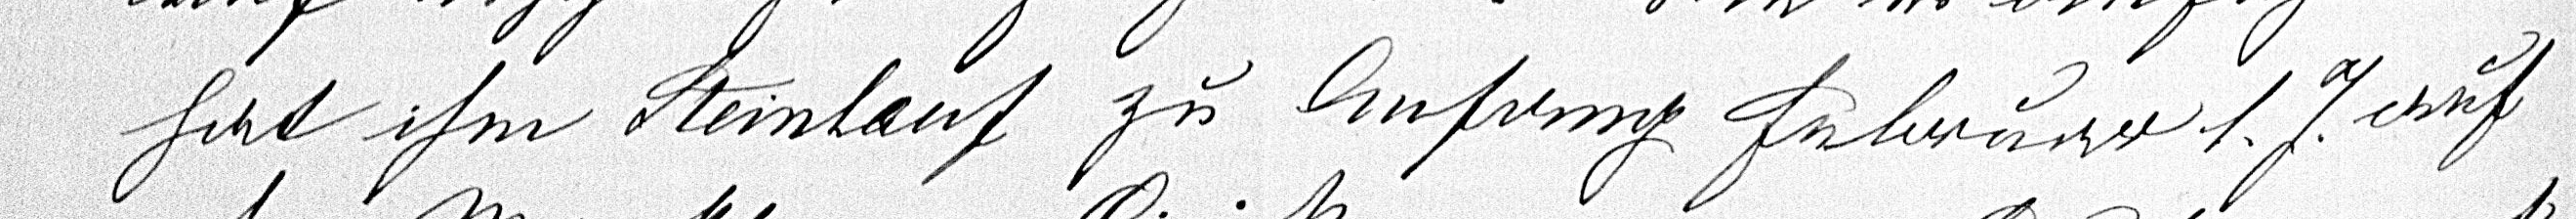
hat ihm Steinlauf zu Anfang Februar l. J. auf
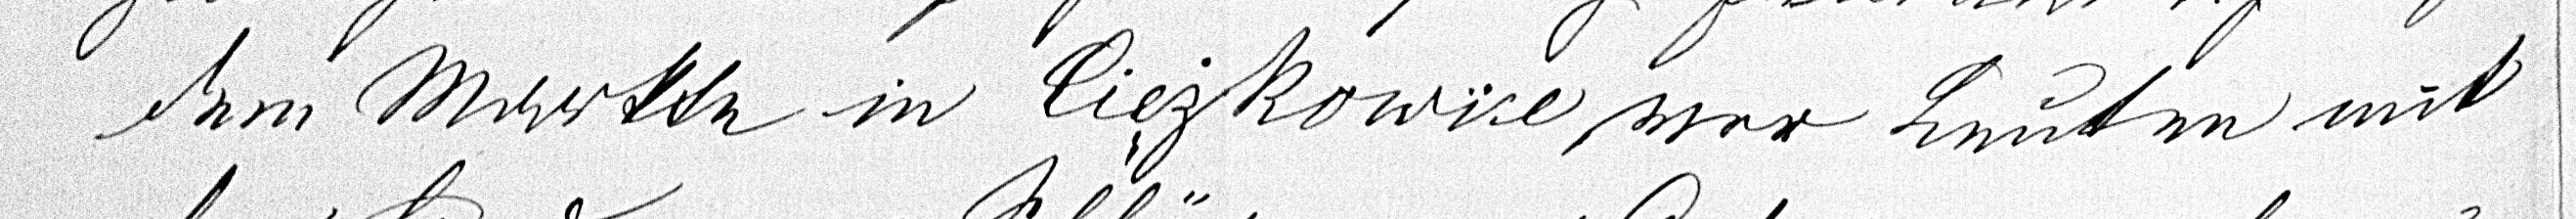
dem Markte in Ciężwxx, wer Leuten mit
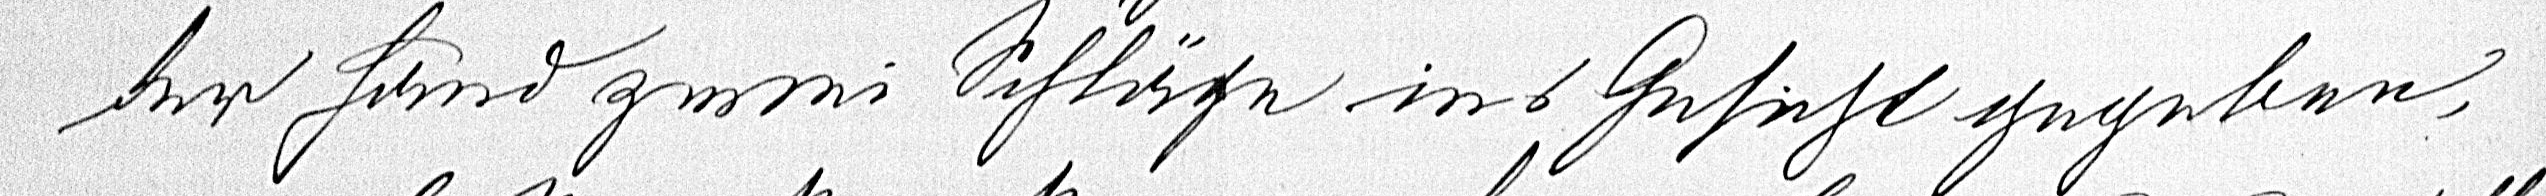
der Hand zwei Schläfe ins Gesicht gegeben,
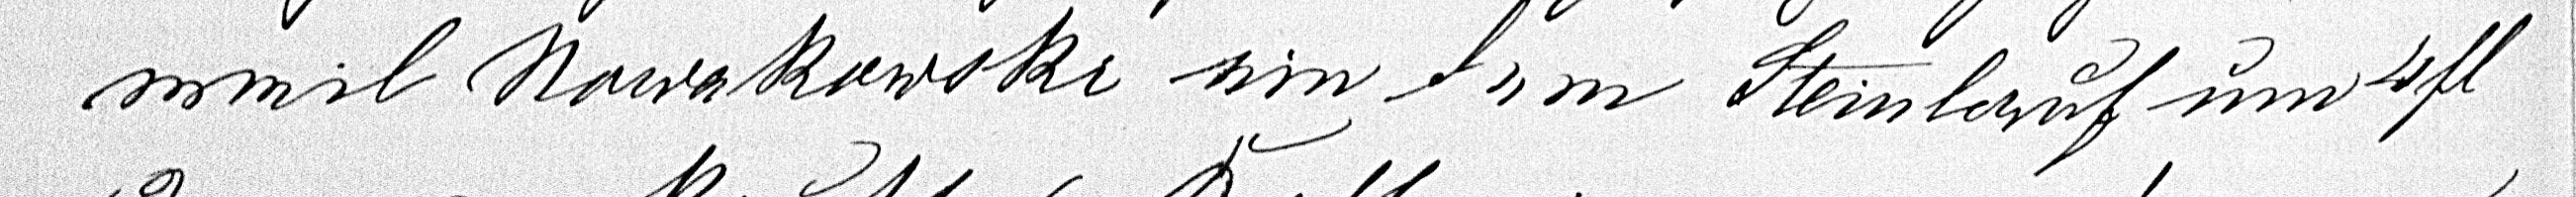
weil Nowakowski ein dem Steinlauf um 4fl
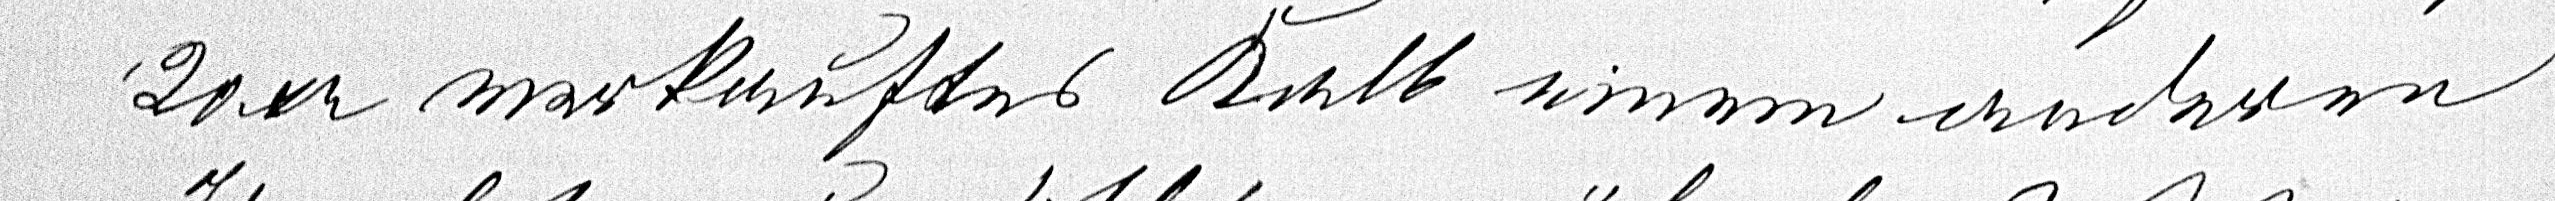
'20xx verkauftes Kalb einem anderen
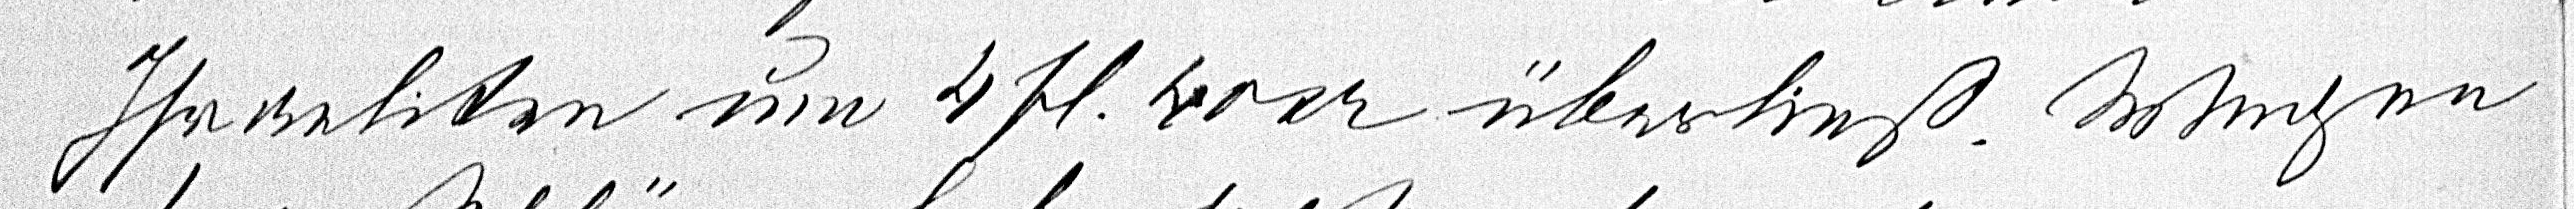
Israeliten um 4 fl. 40 xx überließ. Wegen
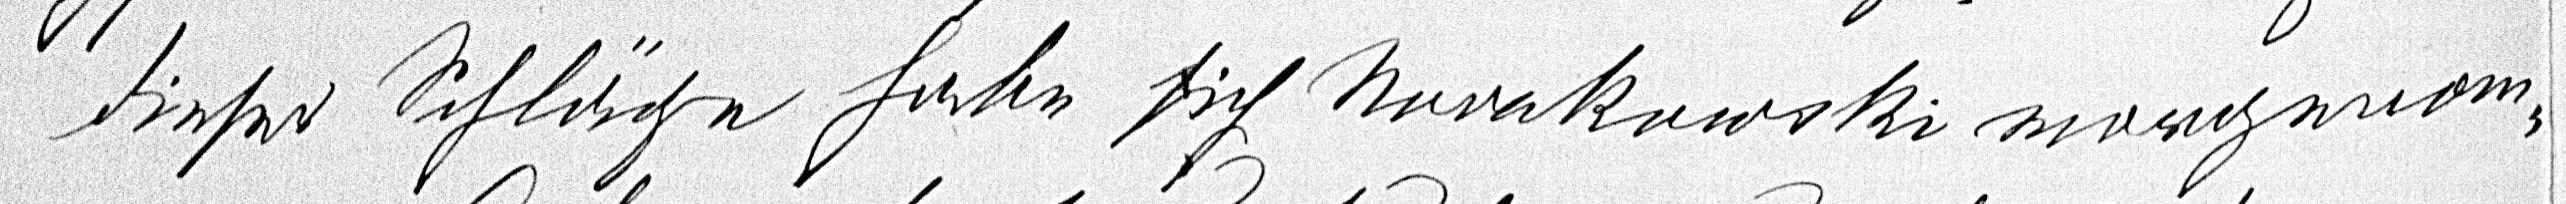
dieser Schläge habe sich Novakowski vorgenom¬
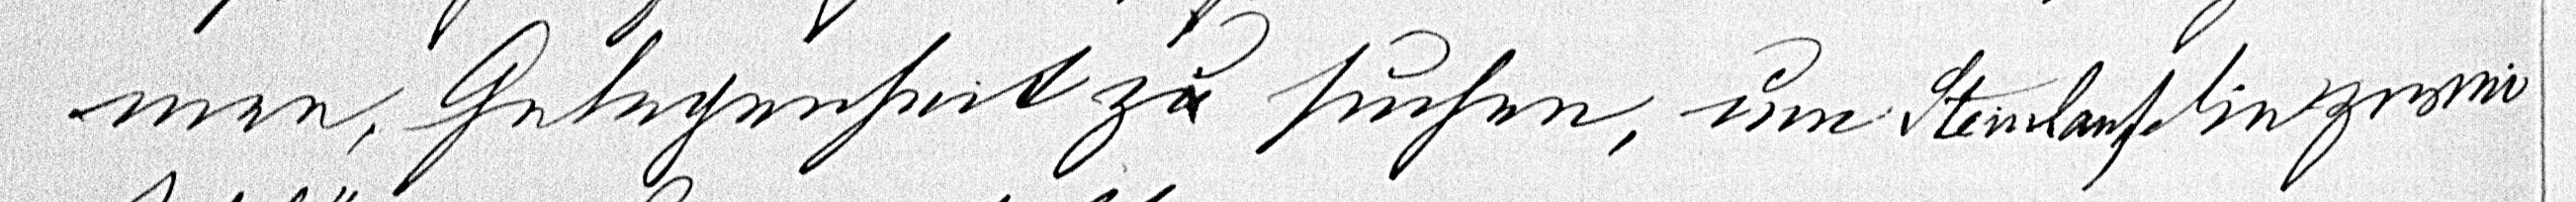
men, Gelegenheit zu suchen, um Steinlauf die zwei
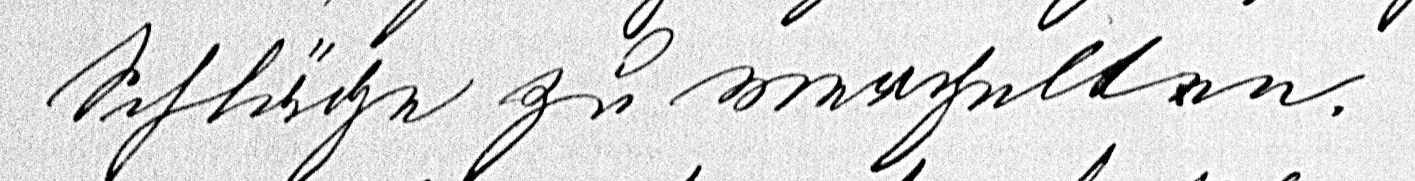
Schläge zu verhalten.
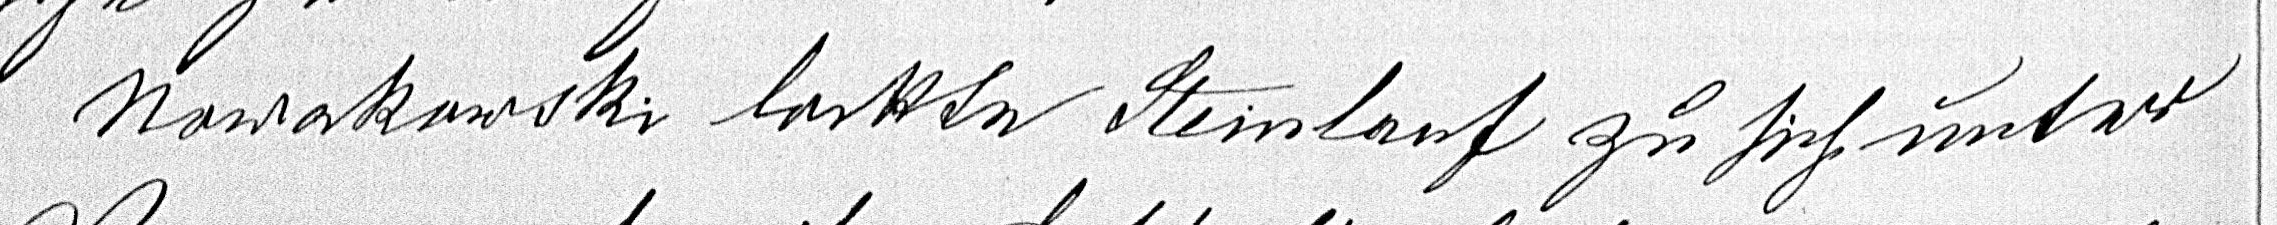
Nowakowski leckte Steinlauf zu sich unter
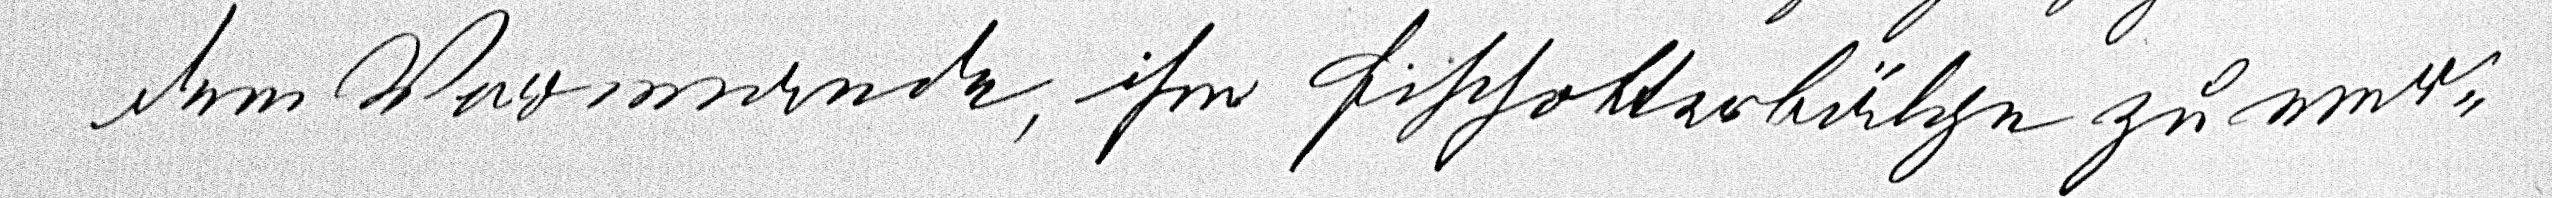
dem Vorwande, ihm Fischxx zu ver¬
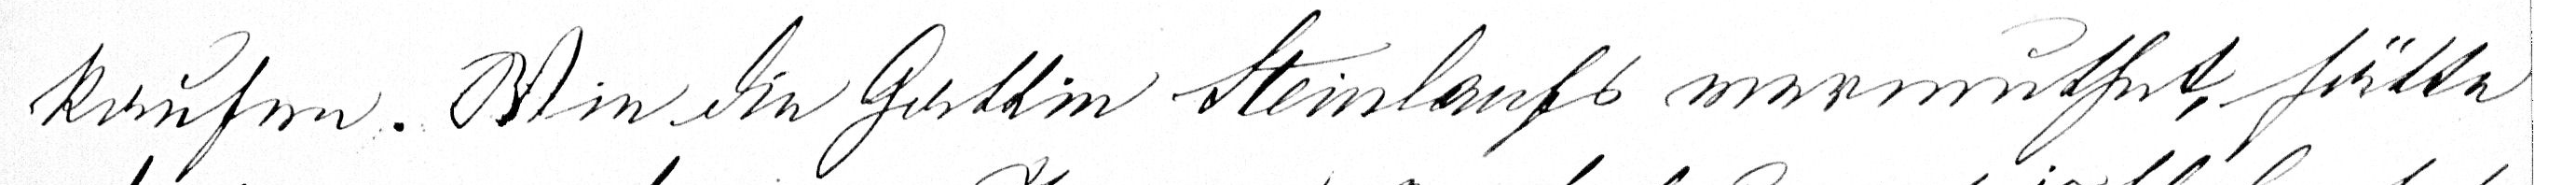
kaufen. Wie die Gattin Steinlaufs vermuthet, hätte
